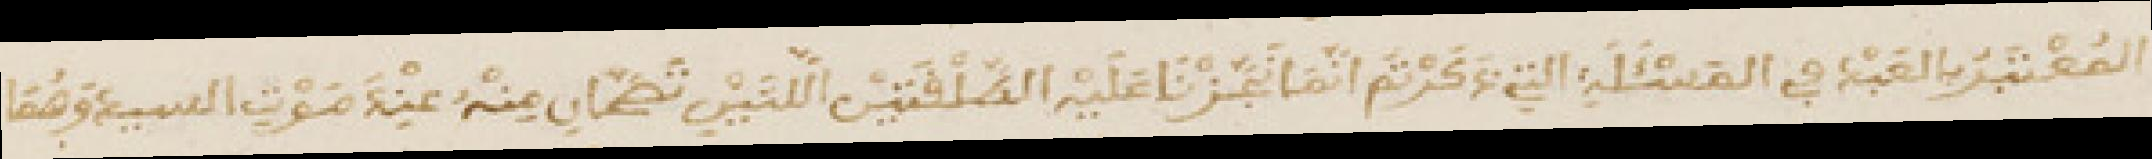المعتبر بالعبد في المسئلة التي ذكرتم انما نجزنا عليه الطلقتين اللتين تصحان منه عند موت السيد وهما
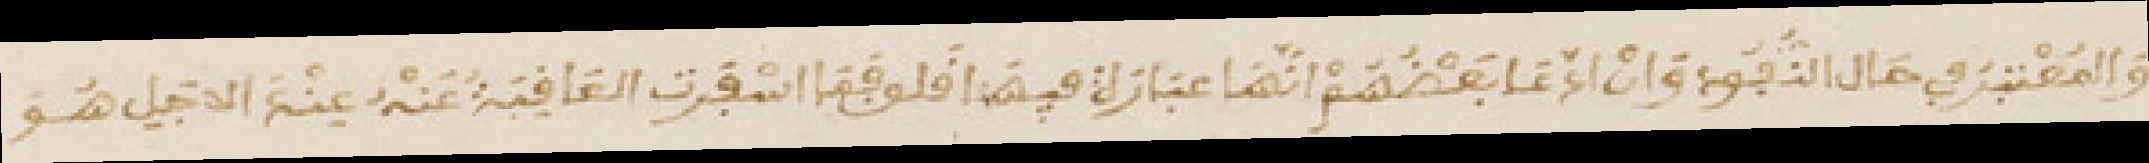والمعتبر في حال النفوذ وان ادعا بعضهم انها عبارة فيها قلق فما اسفرت العاقبة عنه عند الاجل هو
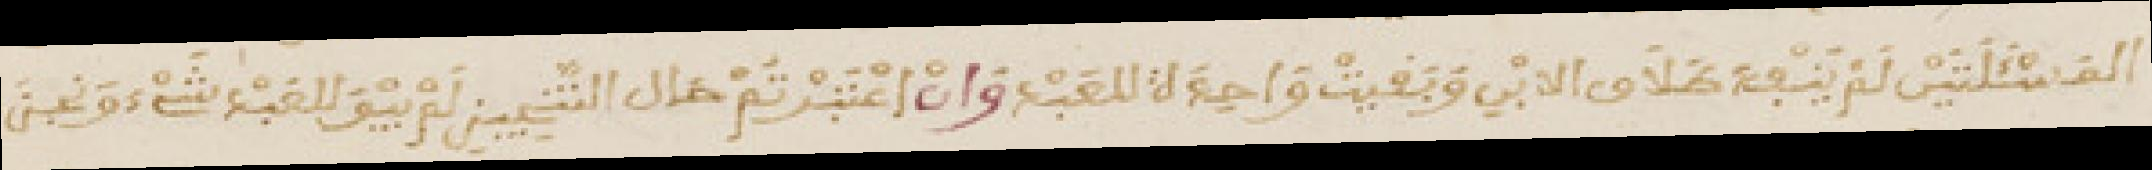المسألتين لم ينفد طلاق الابن وبقيت واحدة للعبد وان اعتبرتم حال التنجيز لم يبق للعبد شيء ونجز
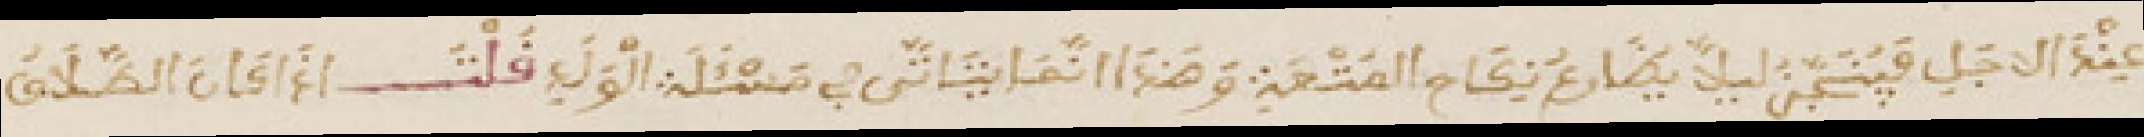عند الاجل فينجز ليلا يضارع نكاح المتعة وهذا انما يتاتى في مسئلة الولد قلت اذا كان الطلاق
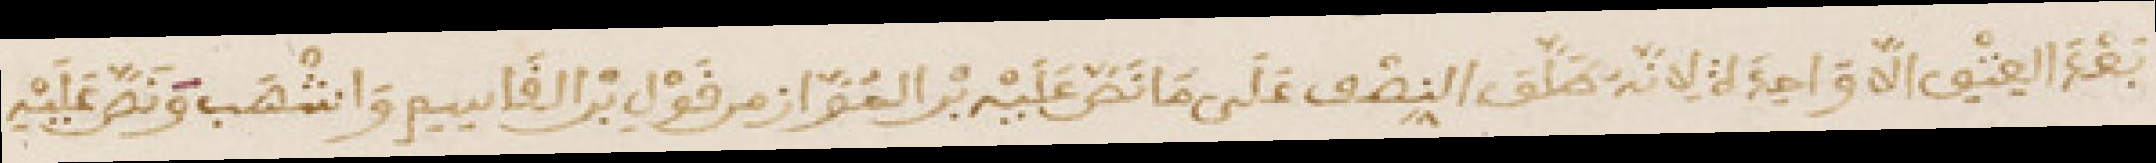بعد العتق الا واحدة لانه طلق النصف على ما نص عليه بن المواز من قول بن القاسم واشهب ونص عليه
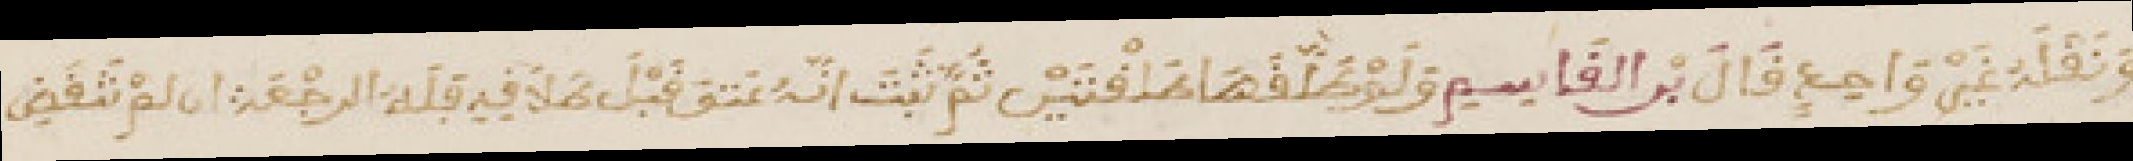ونقله غير واحد قال بن القاسم ولو طلقها طلقتين ثم ثبت انه عتق قبل طلاقه فله الرجعة ان لم تنقض
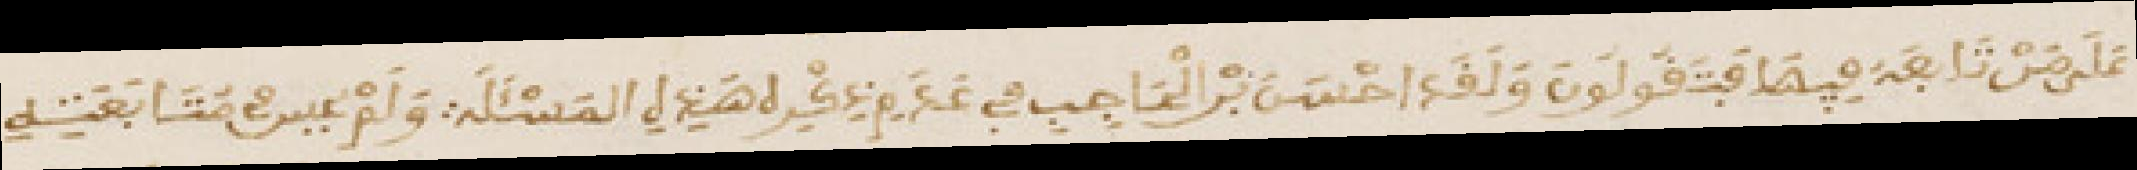على من تابعه فيها فتقولون ولقد احسن بن الحاجب في عدم ذكره هذه المسئلة ولم يحسن في متابعته
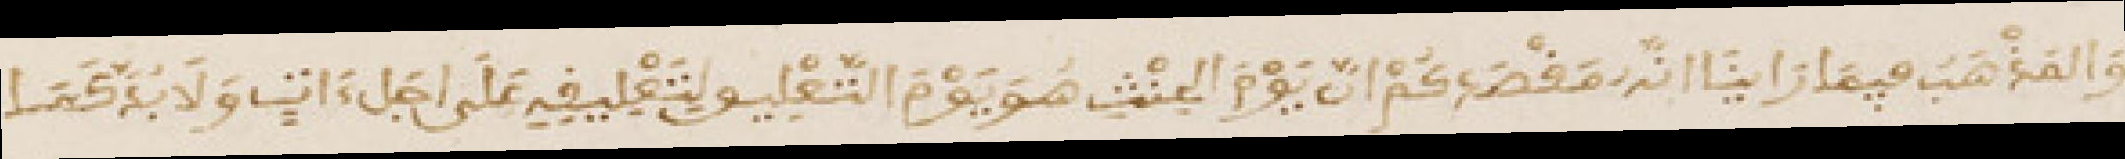والمذهب فيما راينا انه مقصدكم ان يوم الحنث هو يوم التعليق لتعليقه على اجل ءات ولا بد كما
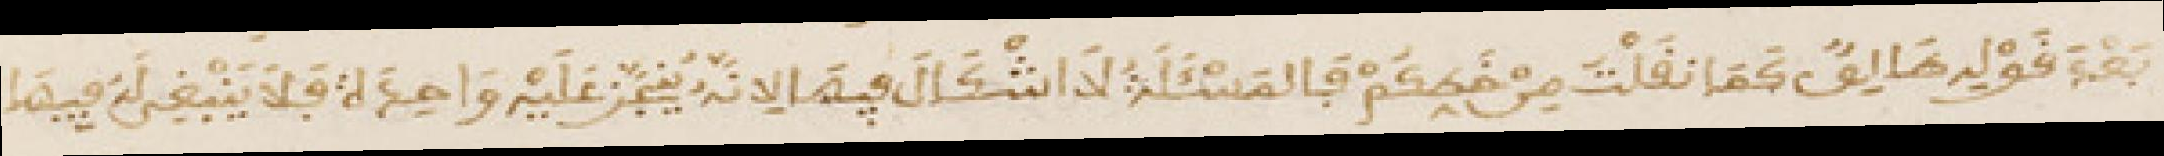بعد قوله طالق كما نقلت من خطكم فالمسألة لا اشكال فيها لانه ينجز عليه واحدة فلا ينبغي له فيها
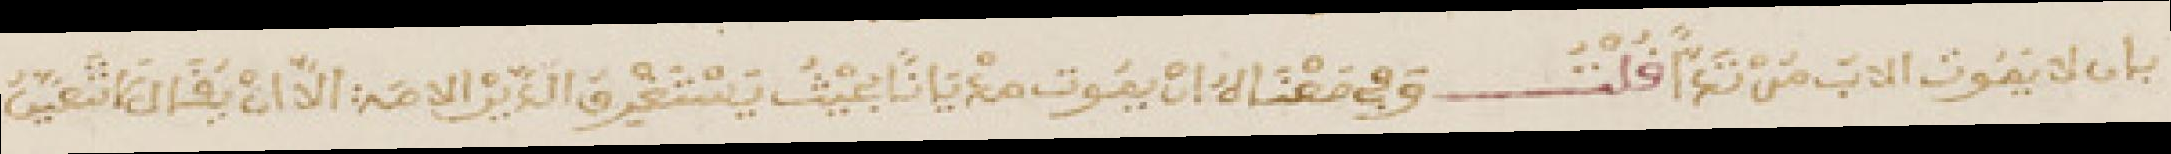بان لا يموت الاب مرتدا قلت وفي معناه ان يموت مديانا بحيث يستغرق الدين الامة الا ان يقال لا تتعين
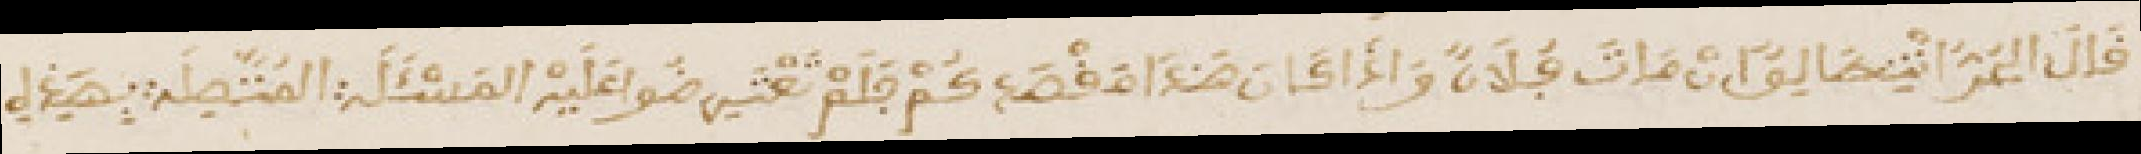قال الحر انت طالق ان مات فلان واذا كان هذا مقصدكم فلم تعترضوا عليه المسئلة المتصلة بهذه
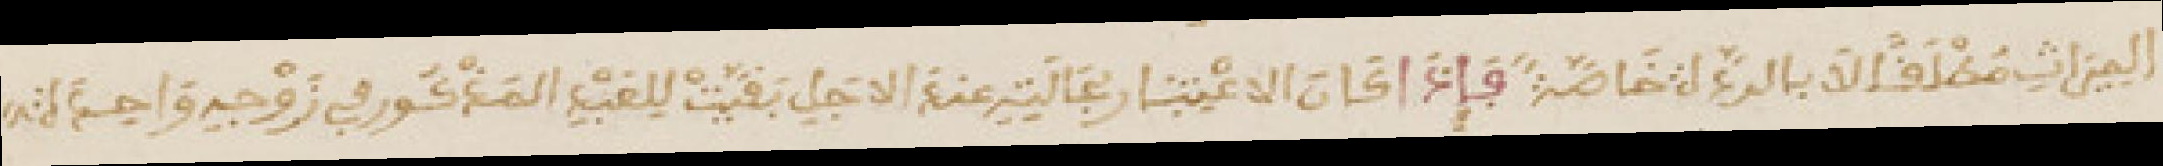الميراث مطلقا لا بالردة خاصة فاذا كان الاعتبار بحالته عند الاجل بقيت للعبد المذكور في زوجه واحدة
